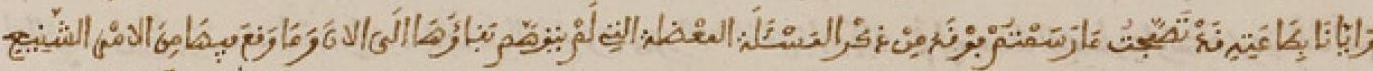و ايانا بطاعته قد تصفحت ما رسمتم فوقه من ذكر المسئلة المعضلة التي لم يتوهم بقاؤها الى الان وما وقع فيها من الامر الشنيع
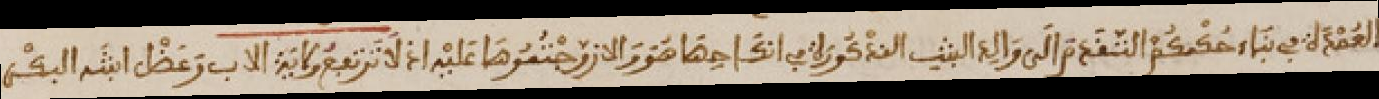العمدة في بناء حكمكم التقدم الى والد البنت المذكورة في انكاحها هو و الا زوجتموها عليه اذ لا ترتفع ولاية الاب وعضل ابنته البكر
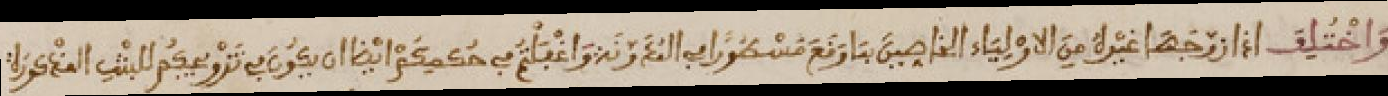و اختلف اذا زوجها غيره من الاولياء الخاصين بما وقع مسطورا في المدونة و اغفلتم في حكمكم ايضا ان يكون تزويجكم للبنت المذكورة
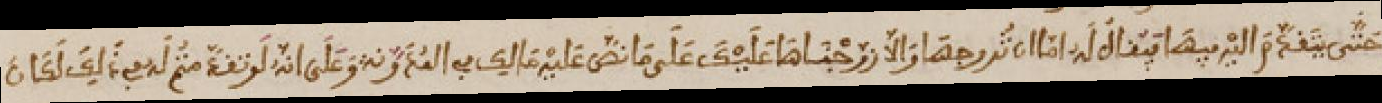حتى يتقدم اليه فيها فيقال له اما ان تزوجها و الا زوجناها عليك على ما نص عليه مالك في المدونة و على انه لو تقدمتم له في ذلك لكان
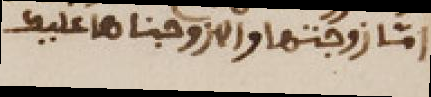اما زوجتها والا زوجناها عليك
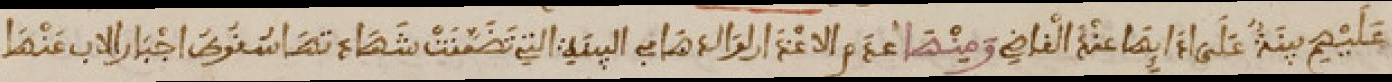عليهم بينة على ادائها عند القاضي ومنها عدم الاعذار لوالدها في البينة التي تضمنت شهادتها سقوط اجبار الاب عنها
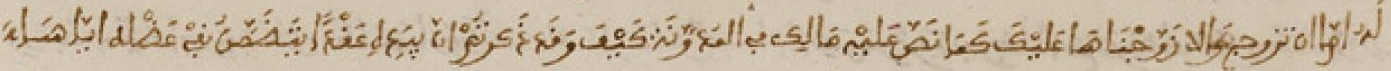له و اما ان تزوج و الا زوجناها عليك كما نص عليه مالك في المدونة فكيف وقد ذكرتم ان بيده عقدا يتضمن نفي عضله اياها
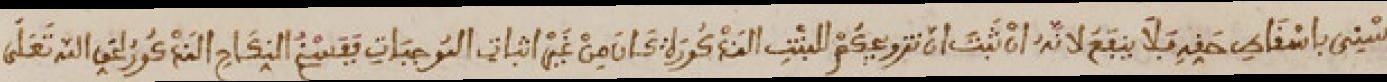سني باسقاط حقه فلا ينفع لانه ان ثبت ان تزويجكم للبنت المذكورة كان من غير اثبات الموجبات ففسخ النكاح المذكور لحق الله تعلى
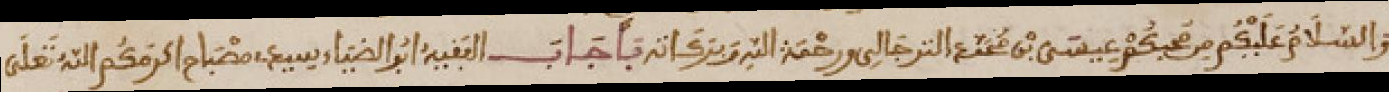والسلام عليكم من محبكم عيسى بن محمد الترجالي و رحمة الله و بركاته فأجاب الفقيه ابو الضياء سيد مصباح اكرمكم الله تعلى
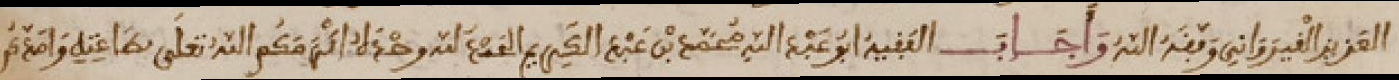العزيز القيرواني وفقه الله واجاب الفقيه ابو عبد الله محمد بن عبد الكريم الحمد الله وحده اكرمكم الله تعلى بطاعته وأمدكم
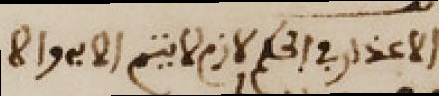الاعذار في الحكم لازم لا يتم الا به والا
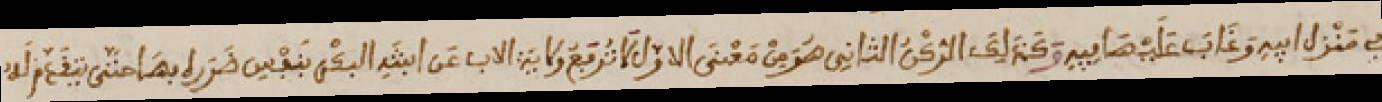في منزل ابيه و غاب عليها فيه وكذلك الركن الثاني هو من معنى الاول لا ترفع ولاية الاب عن ابنته البكر بنفس ضرره بها حتى يتقدم له
